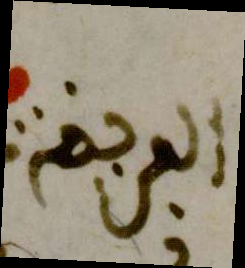الفريضة
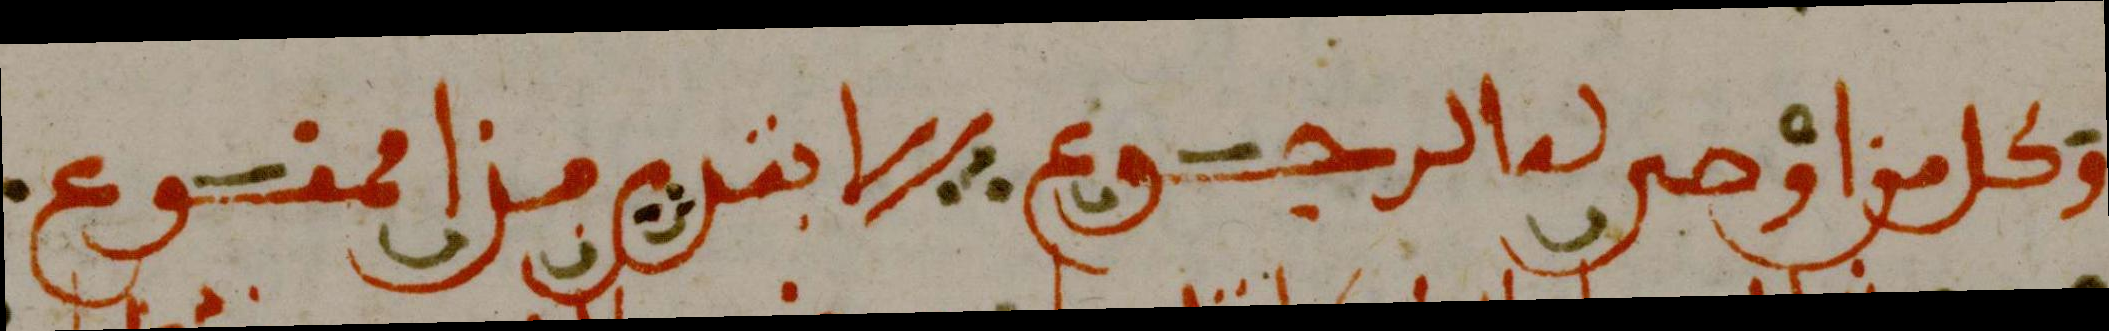وكل من اوصى له الرجوع الابتد بير فذا ممنوع
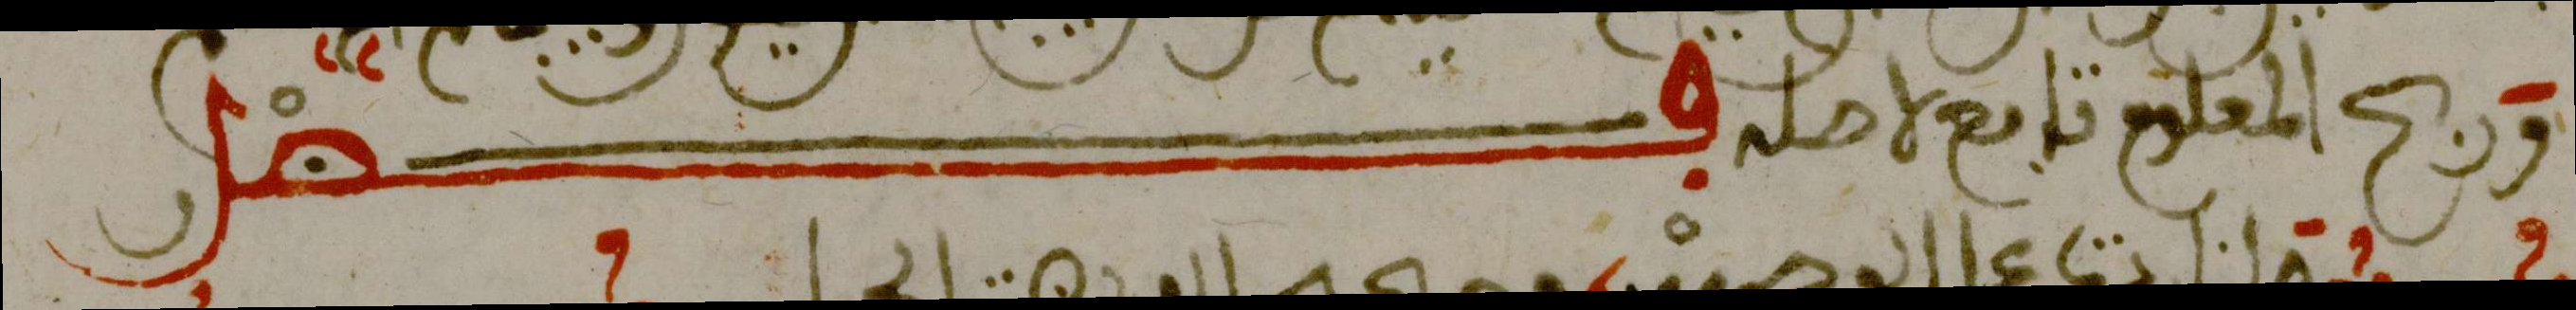ورج المعلوم تابع لا صله فصل
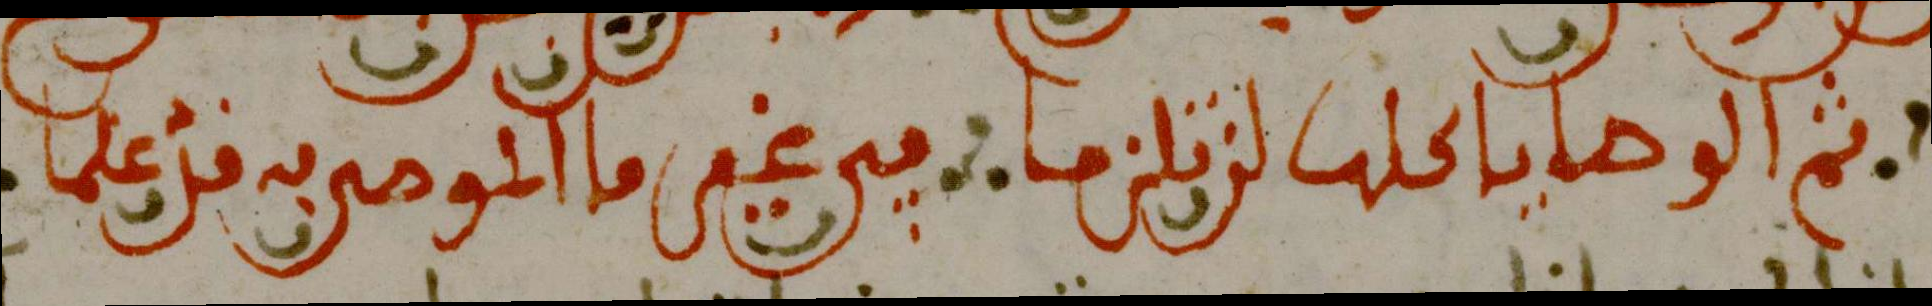ثم الوصايا كلها لن تلزما في غير ماالموصى به قد علما
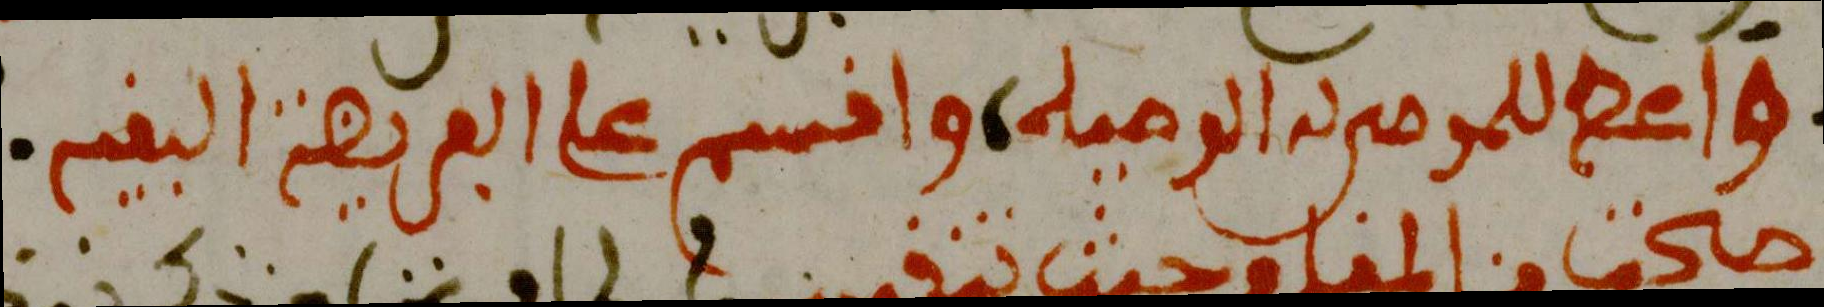واعط للموصى له الوصيه اقسم على الفريضة البقيه
